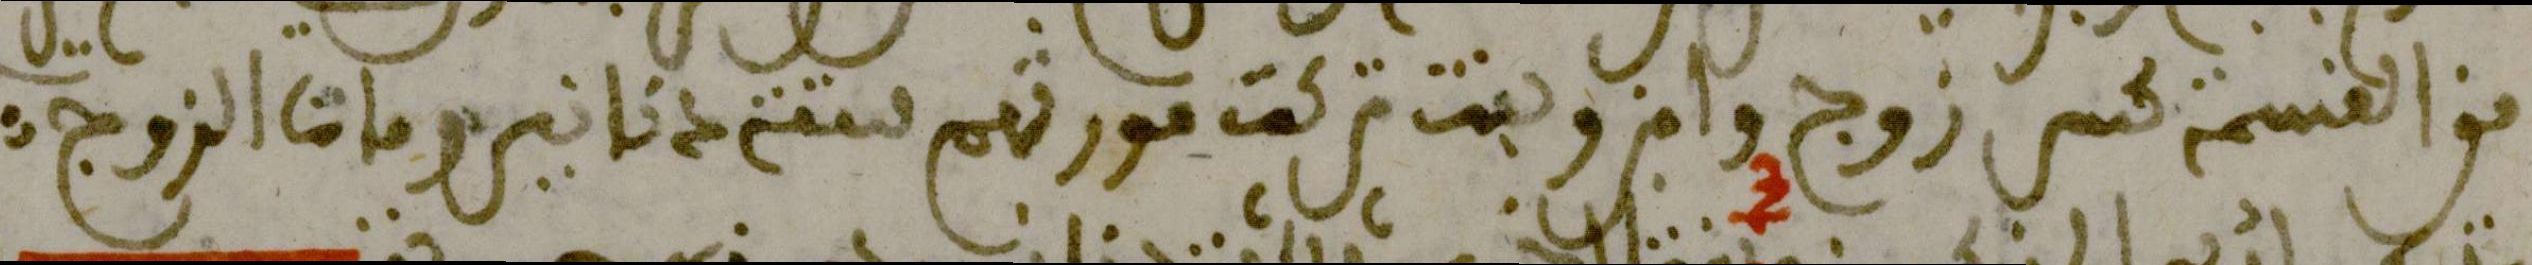من القسمة كسر زوج وابن وبنت تركت مورثهم ستة دنانير ومات الزوج
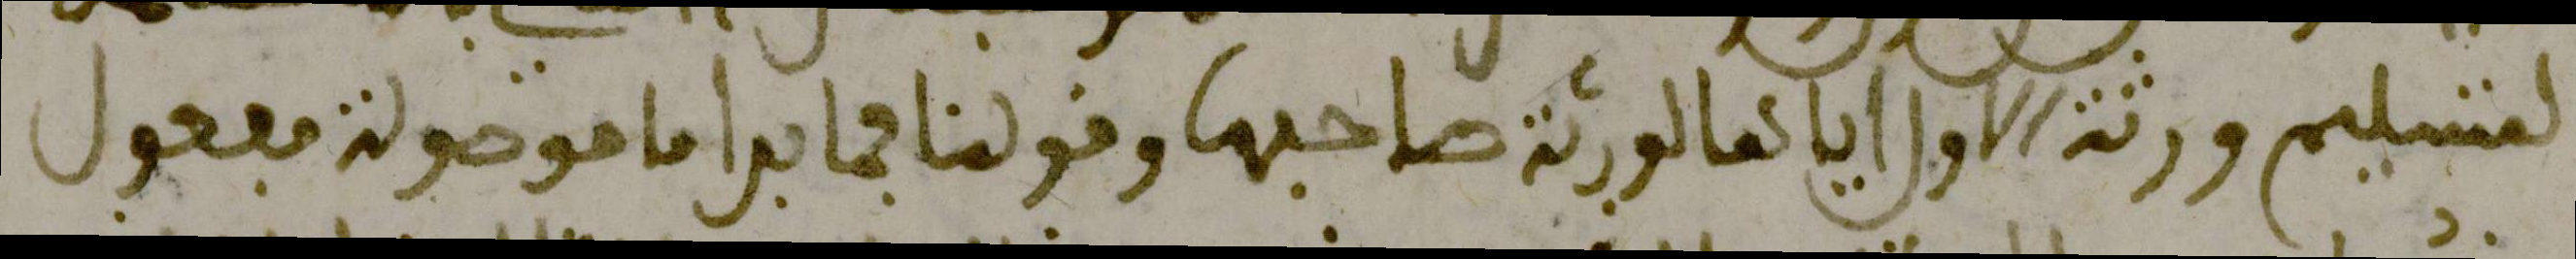لتسليم ورثة الاول اياها لورثة صاحبها وقولنا فما بدا ما موصولة مفعول
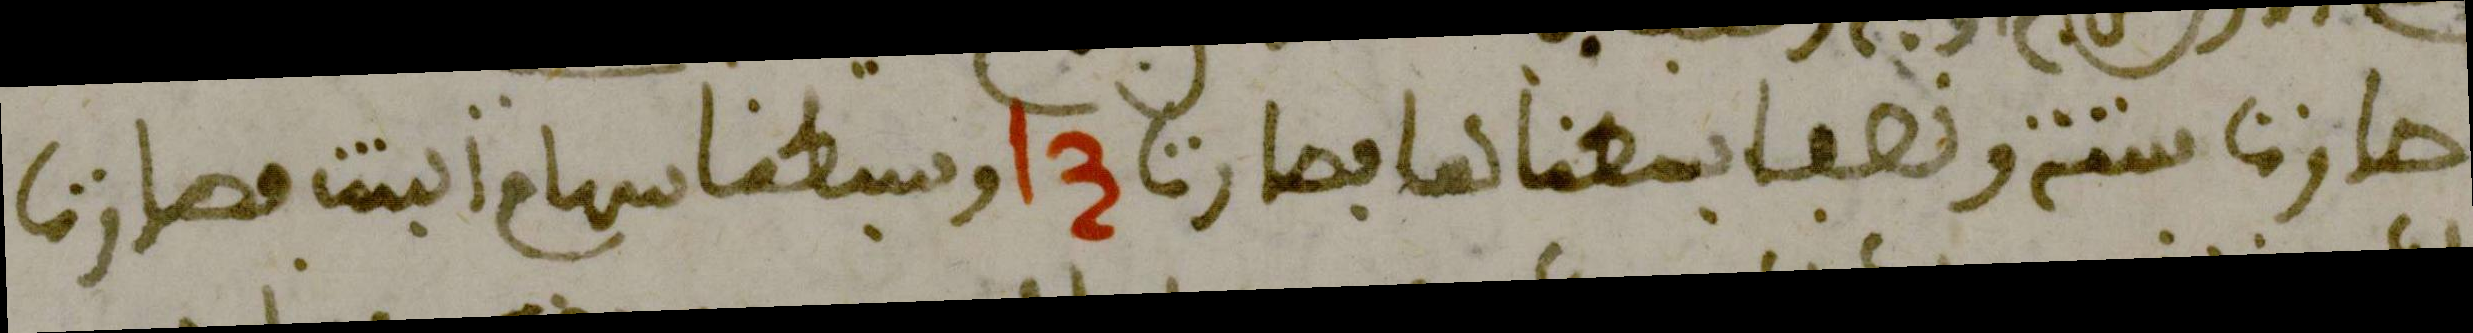صارت ستة ونصفا بسطناها فصارت 13 بسطنا سهام البنت فصارت
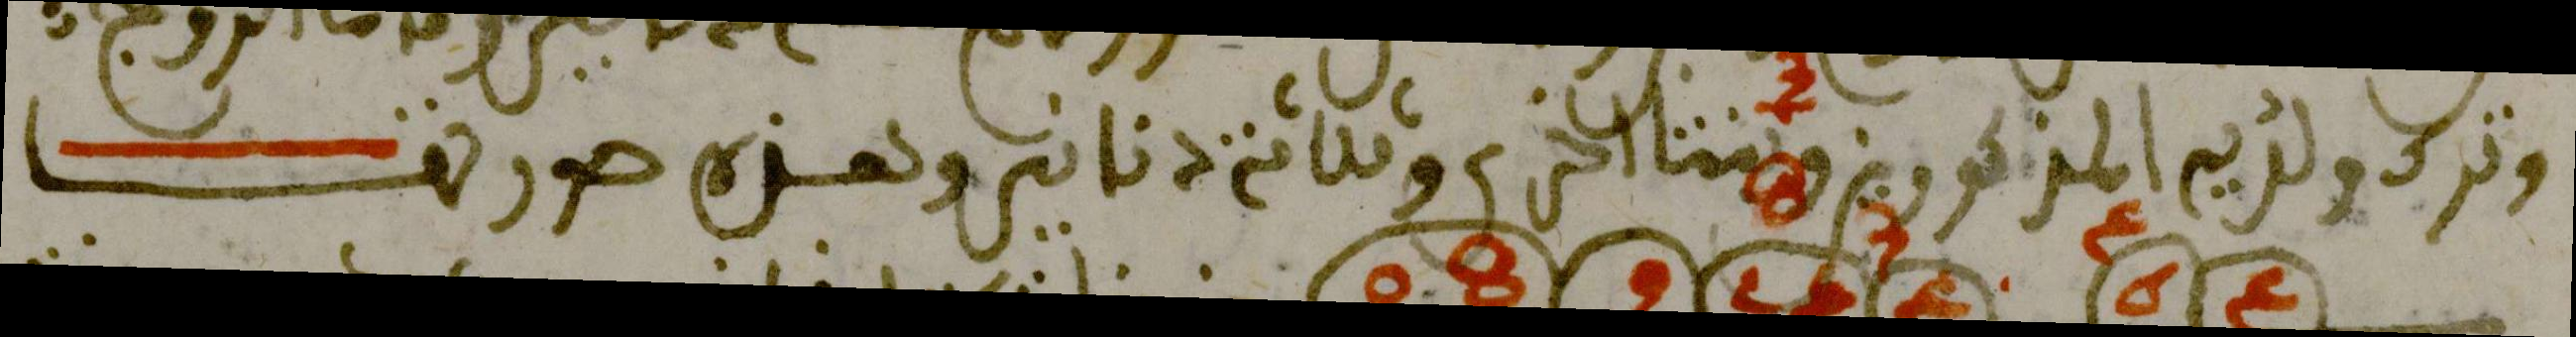وترك ولديه المذكورين وينتا اخرى وثلاثة دنانير وهذه صورتها
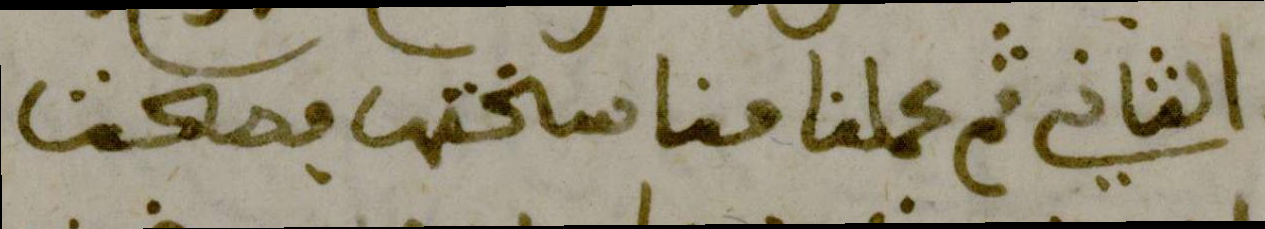الثاني ثم عملنا منا سختها فصحت
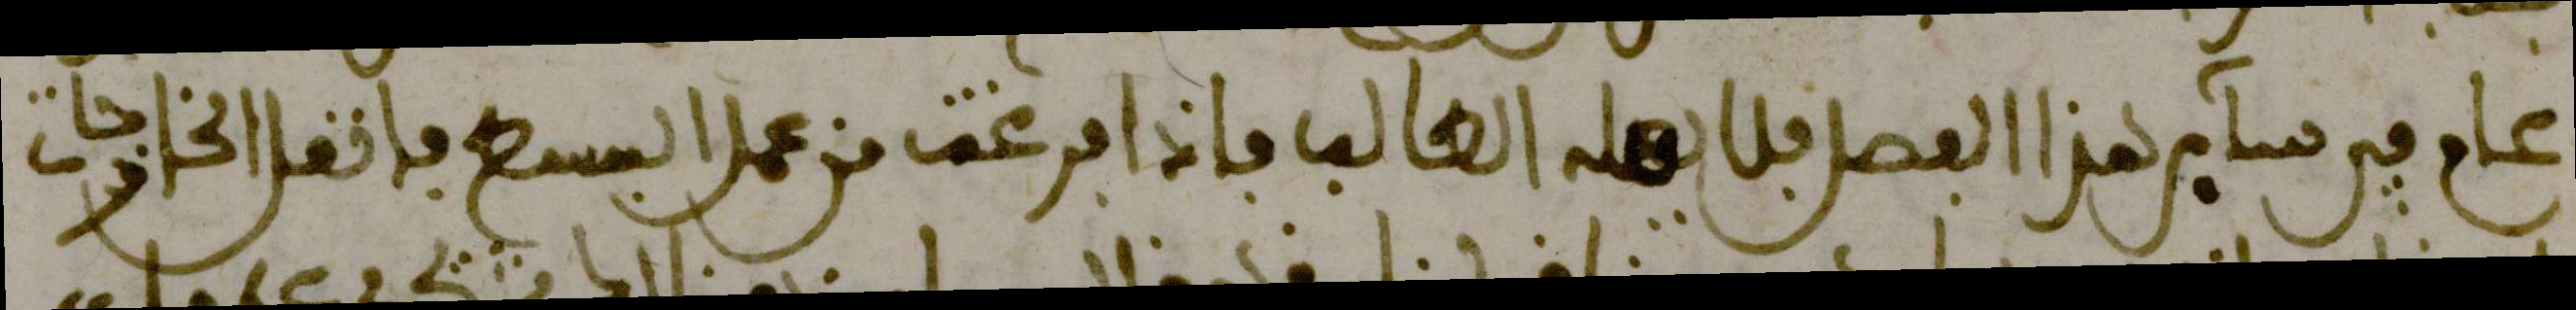عام في سائر هذا الفصل فلا يهمله الطالب فاذا فرغت من عمل البسط فانقل الخارجات
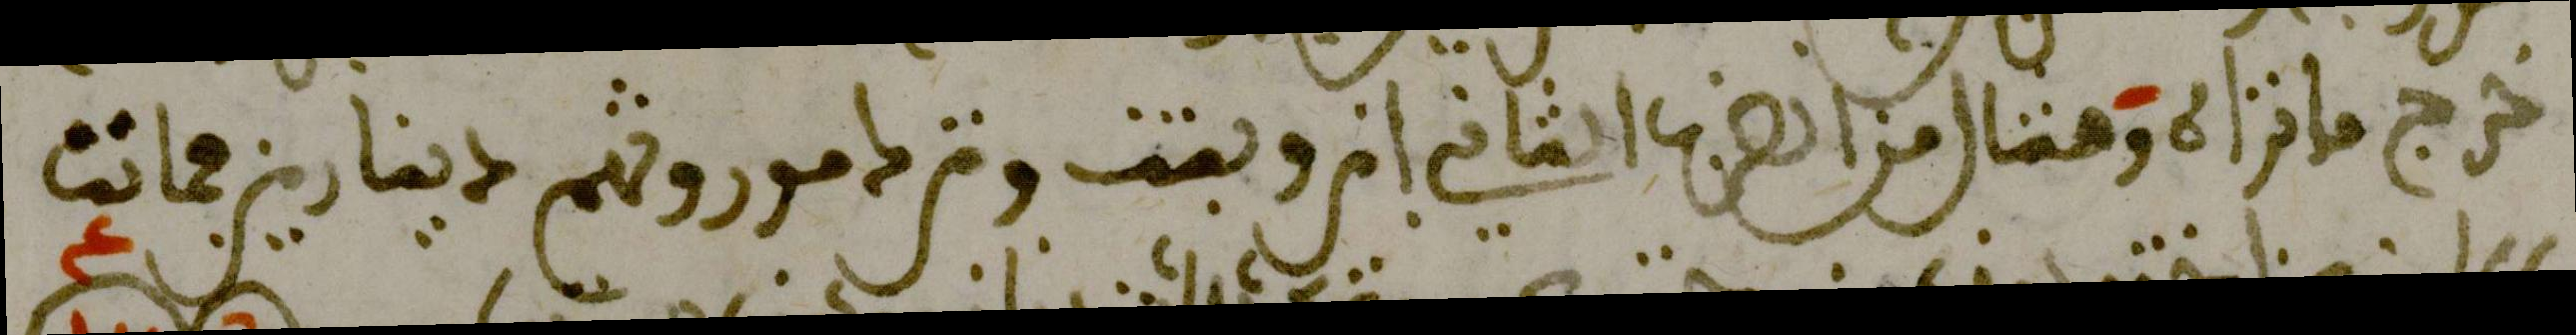خرج ما تراه ومثال من الضرب الثاني ابن وبنت وترك موروثهم دينارين فمات
